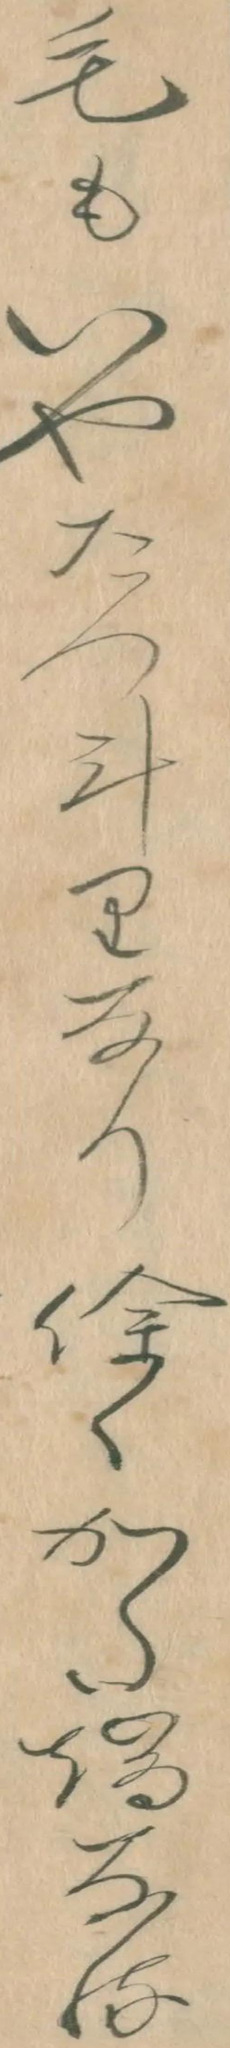毛もいやたつ計なり徐くかた端なる
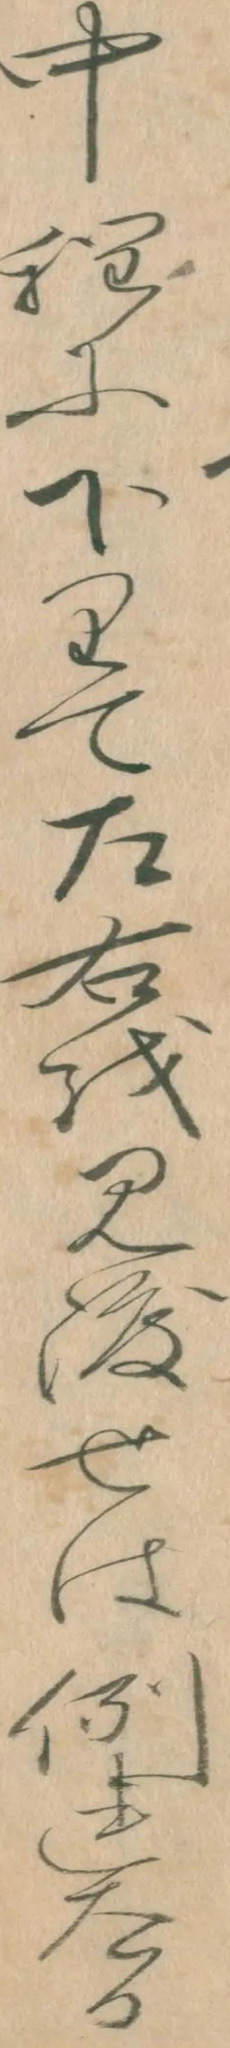中程に下りて左右を見渡せは倒れたる
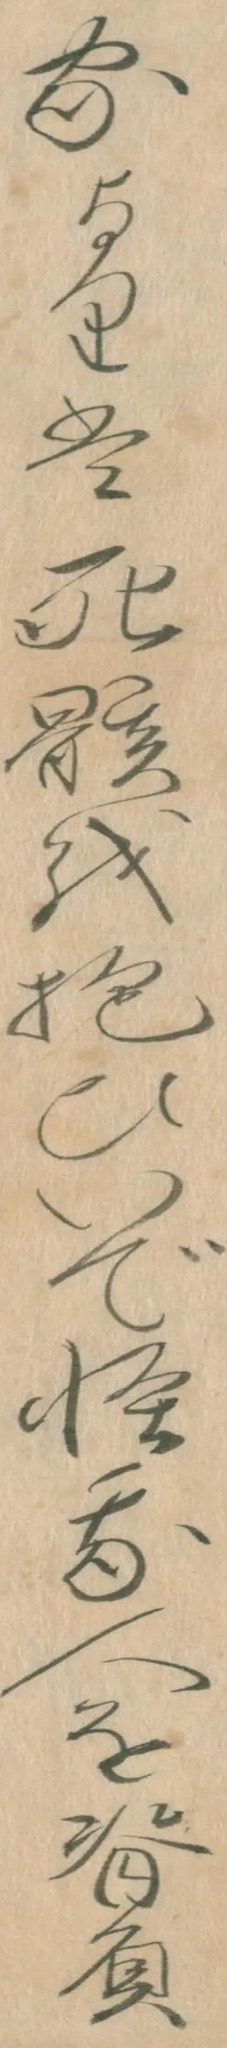家よりは死骸を抱ひいで怪我人を背負
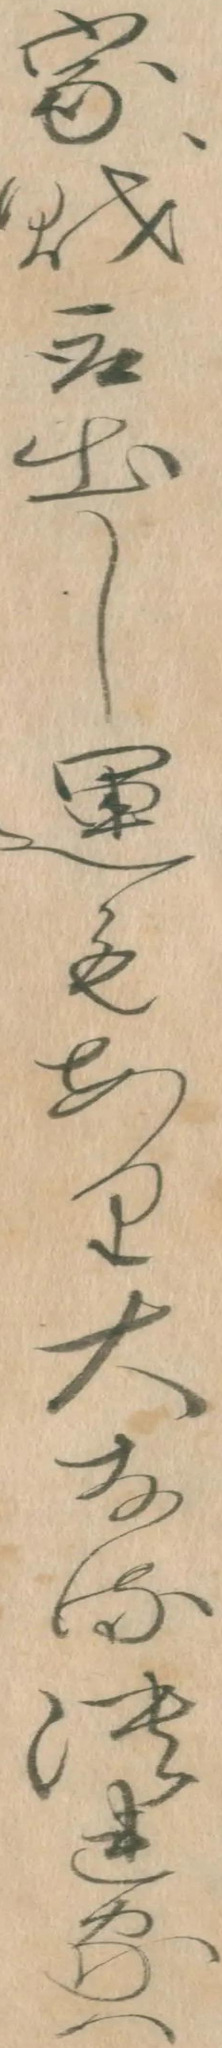家財取出し運もあり大なる潰れ家は
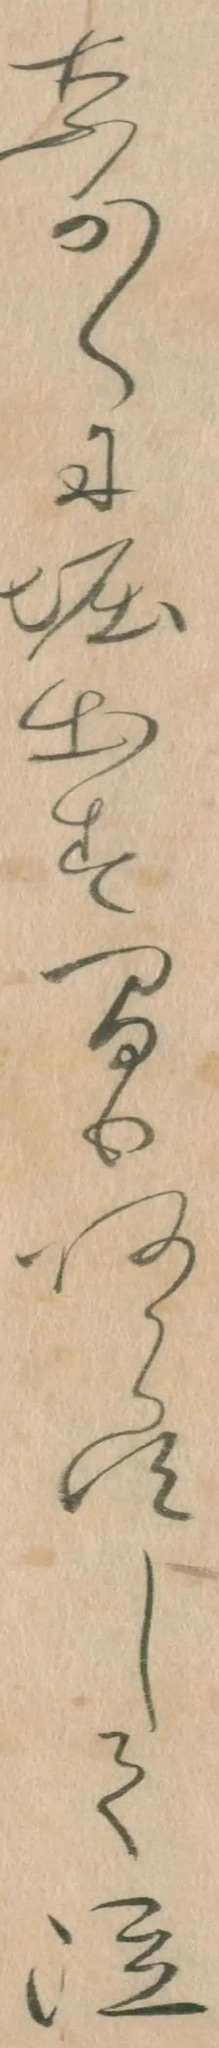なか〳〵に堀出す間もあらすして泣
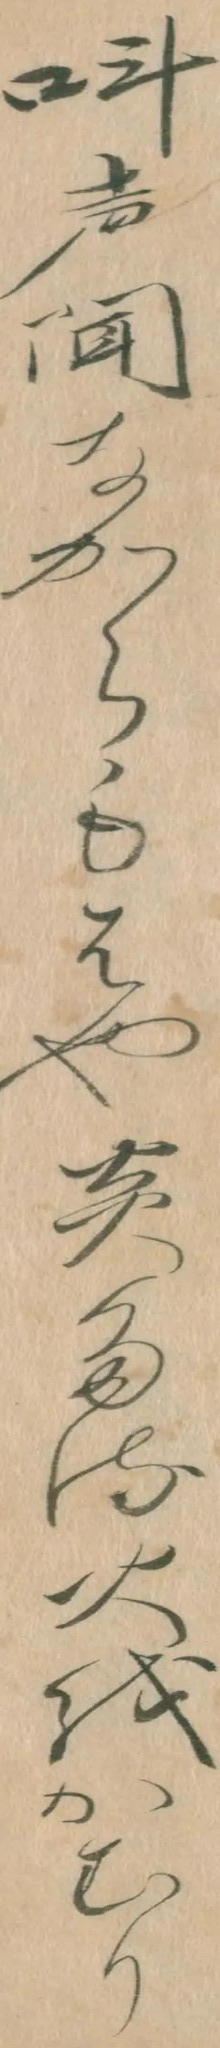叫声聞ながらもはや炎たる火をかむり
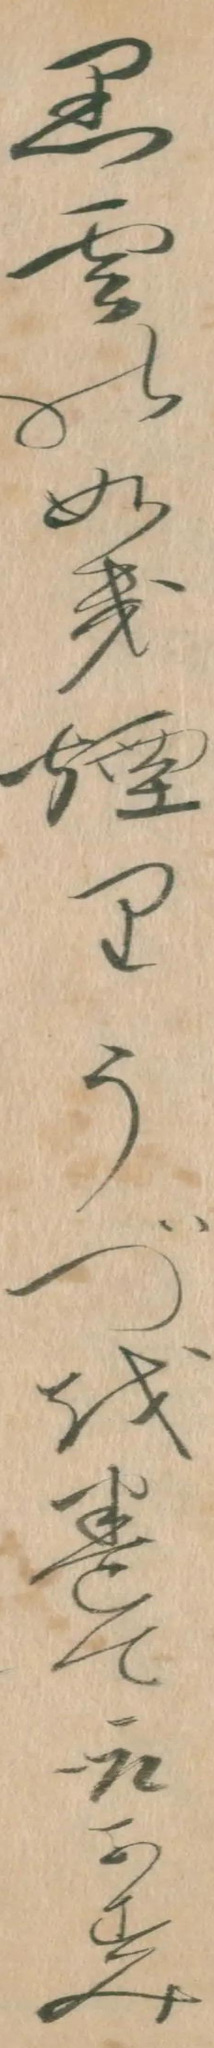黒雲の如き烟りうづを巻て取かすみ
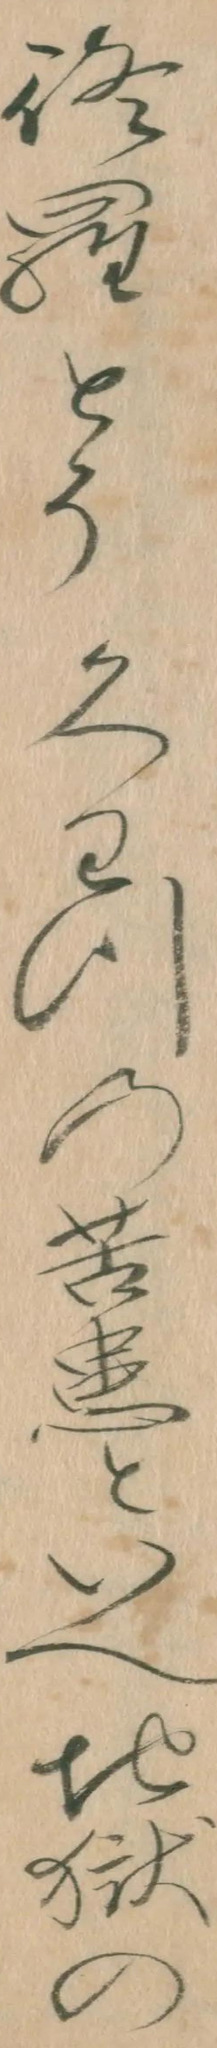修羅とうくわつの苦患といへ地獄の
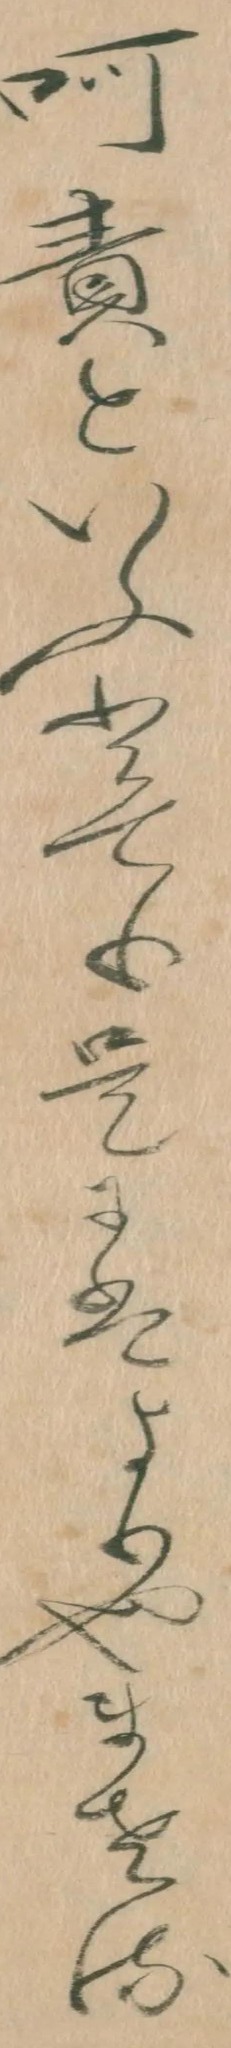呵責といふとても是にはよもやまさる
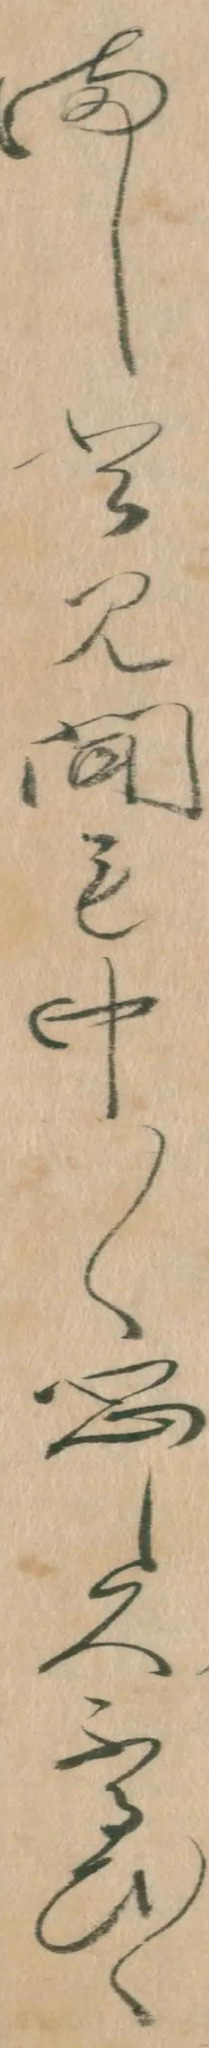ましと見聞も中〳〵恐しくふるひ〳〵
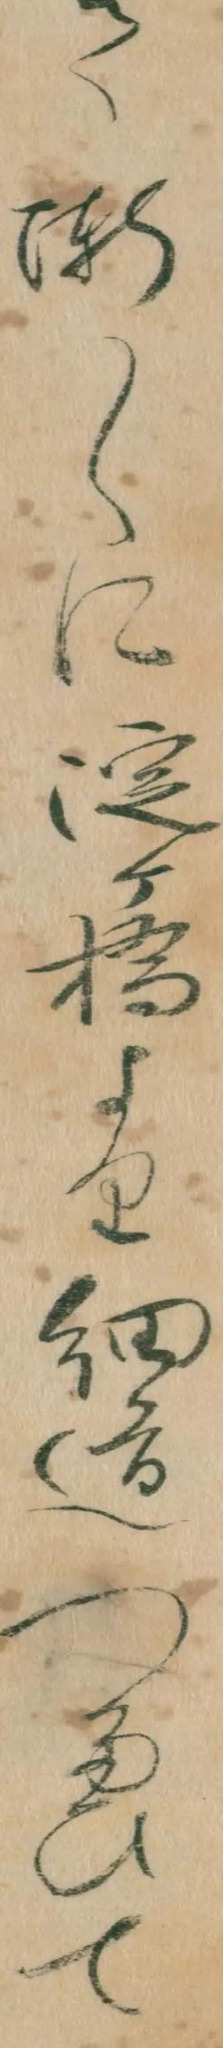て漸〳〵に淀ケ橋より細道つたひて
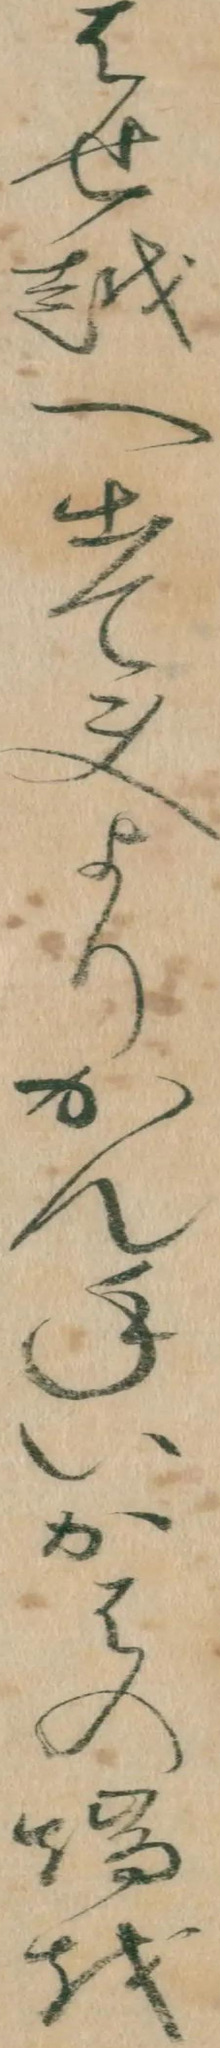はせ越へ出て夫よりかんねいかはの端を
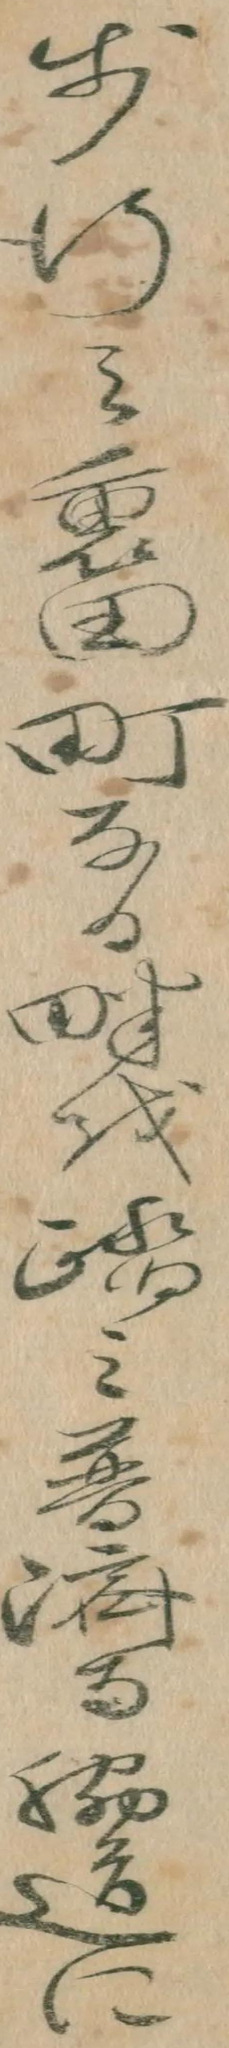歩行て？裏田町なる畔を踏み普済寺脇道に
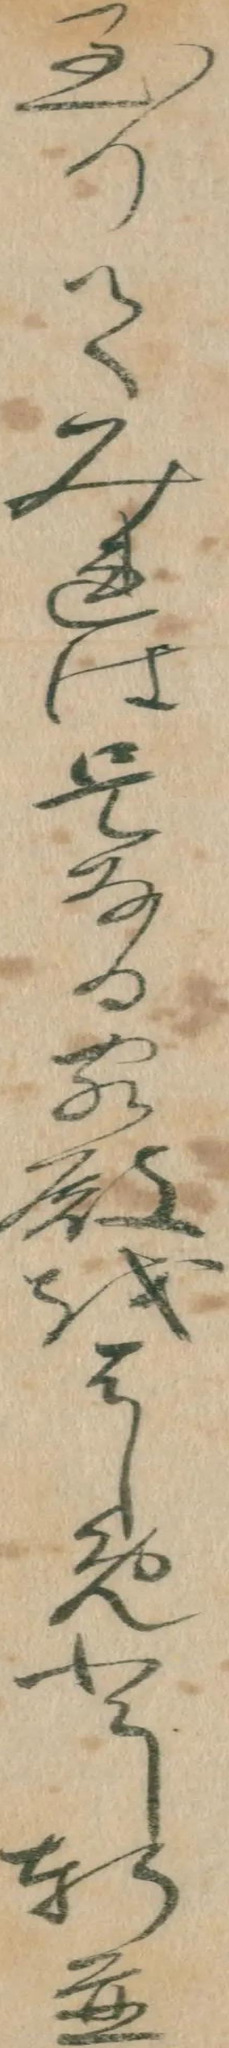至りてみれは是なる客殿をはしめとし軒並
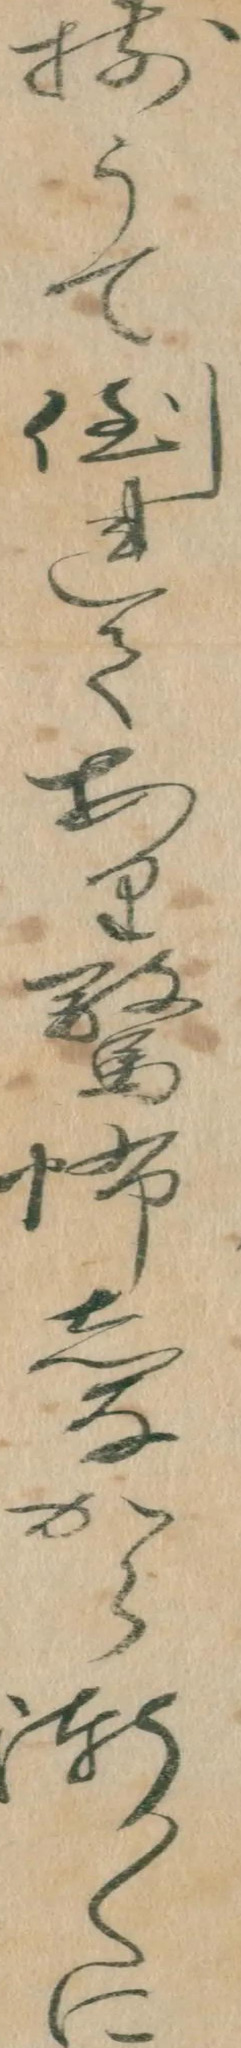揃うて倒れてあり驚怖しなから漸〳〵に
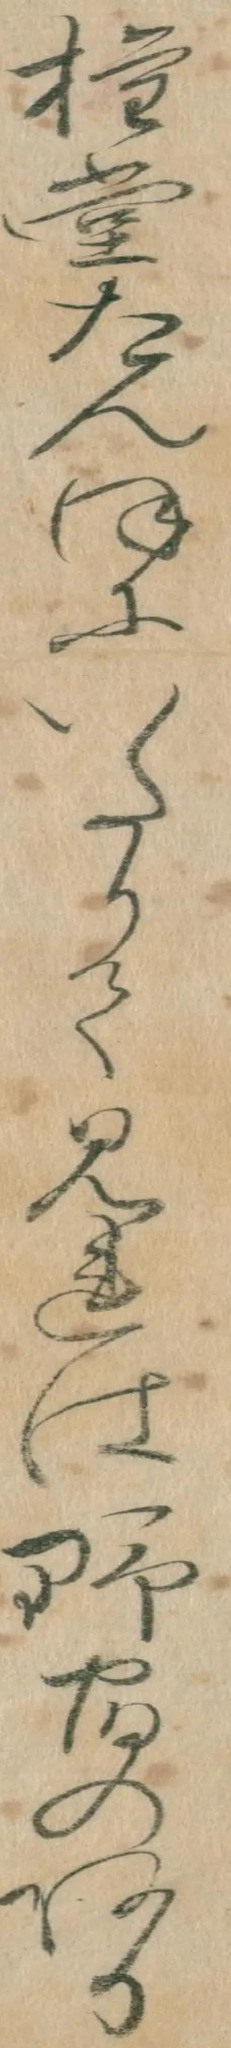権堂たんほにいたりて見れは野宿のあり
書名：俗語之種. [4]
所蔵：国立国会図書館 National Diet Library, JAPAN
